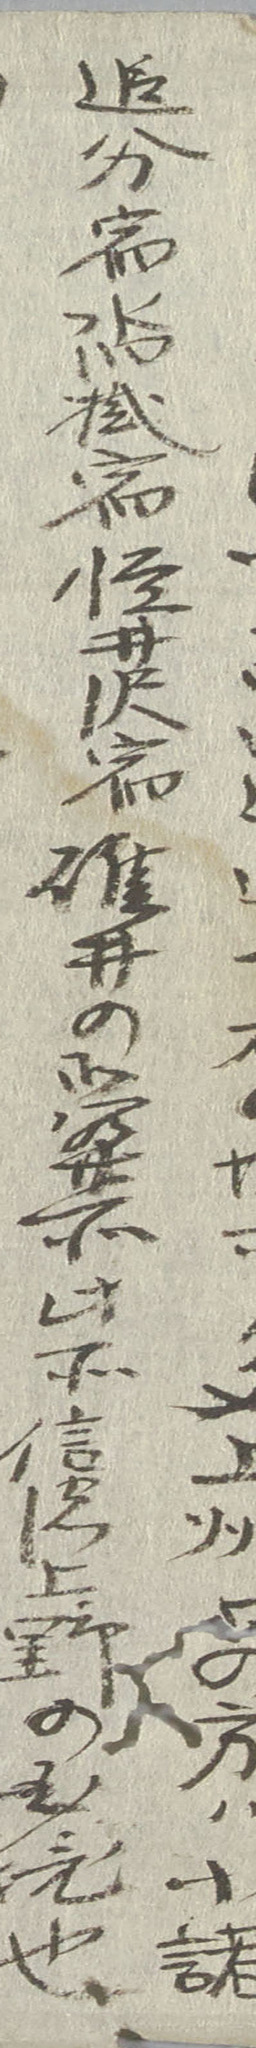追分宿沓掛宿軽井沢宿碓井の御関所此所信濃上野の国境也
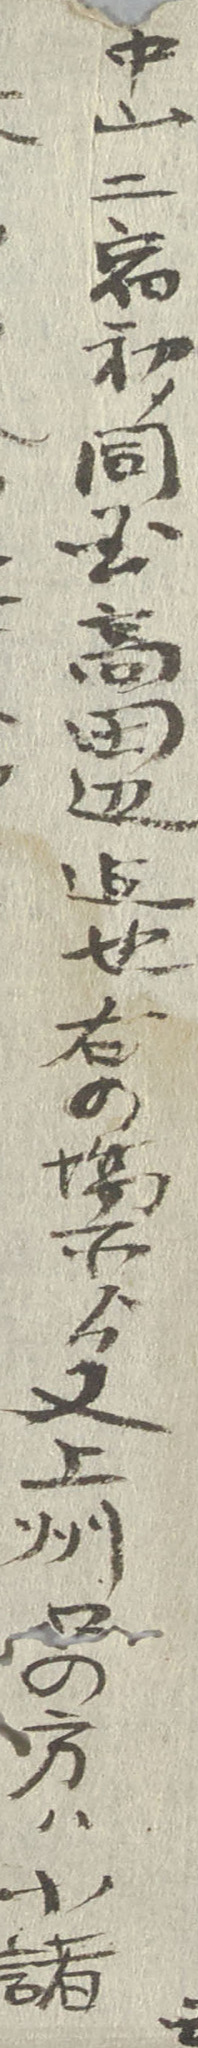中山ニ宿初メ同国高田辺迠也右の場所ゟ又上州口の方ハ小諸
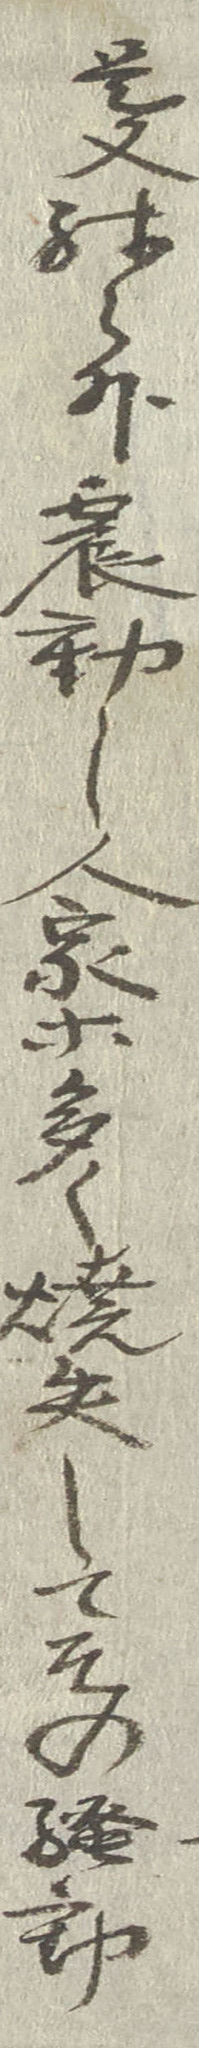是又殊之外震動し人家等多く焼失してその騒動
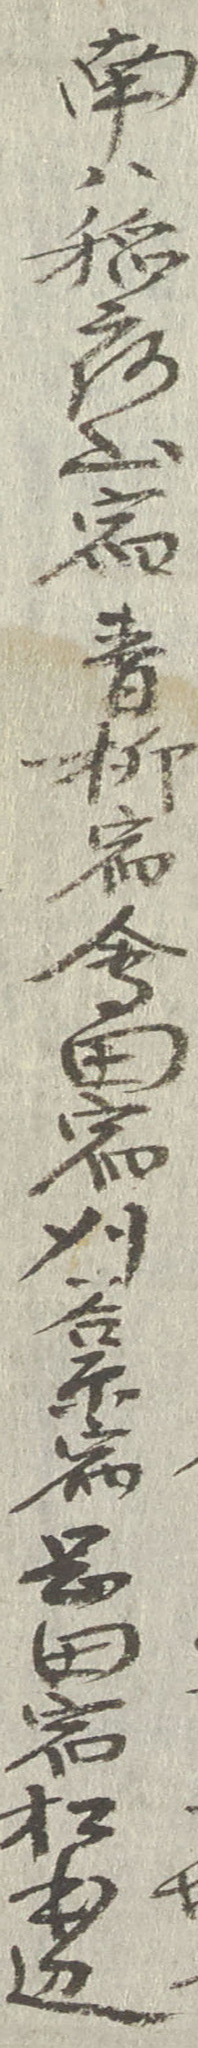南ハ稲荷山宿青柳宿會田宿刈谷原宿岡田宿松本辺
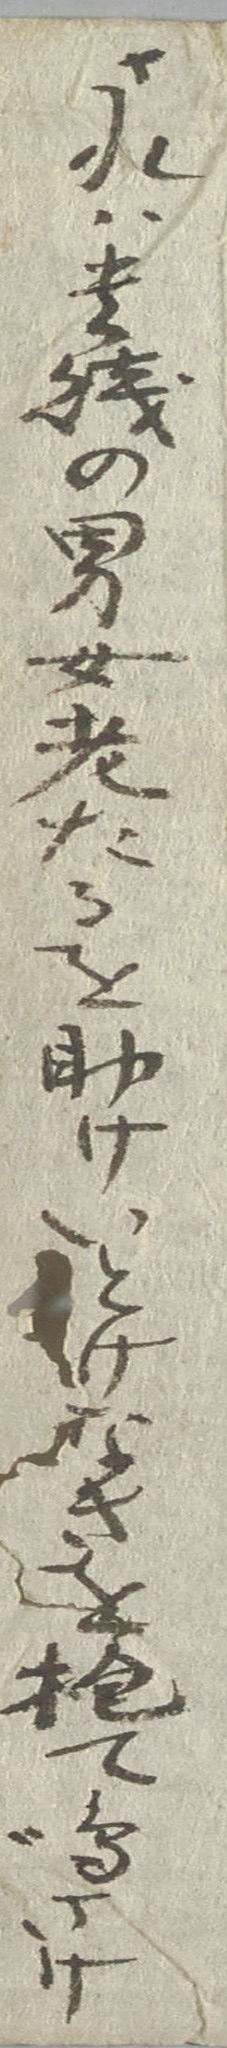されハ貴賤の男女老たるを助けいとけなきを抱て鳴さけ
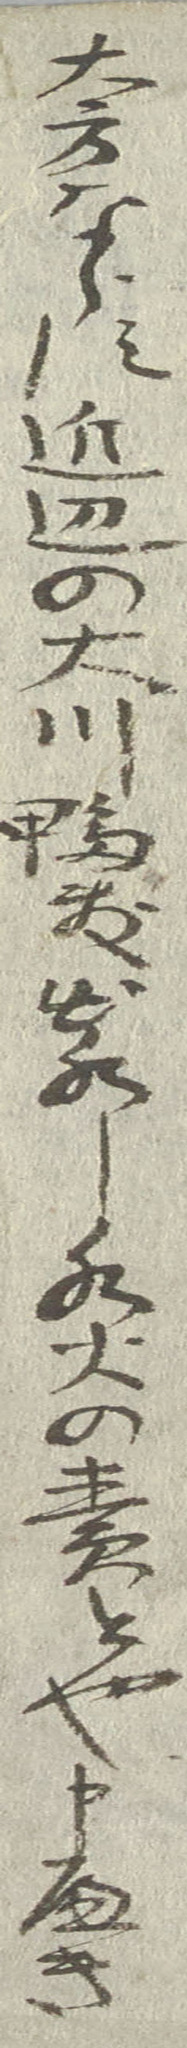大方ならす近辺の大川夥敷出水し水火の責とや申へき
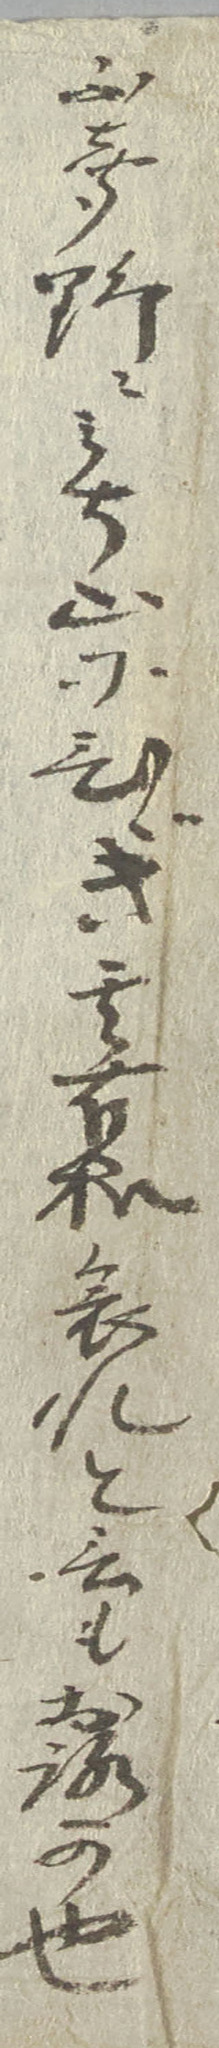ふ聲野ニミち山にひゞき其有様哀れと言もおろか也
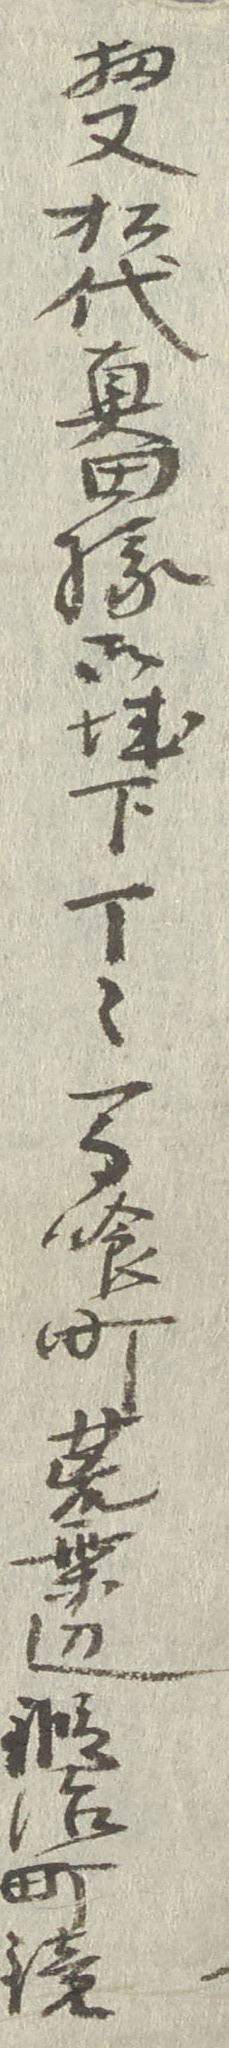扨又松代真田様御城下丁々馬喰町荒葉辺鍛冶町鏡
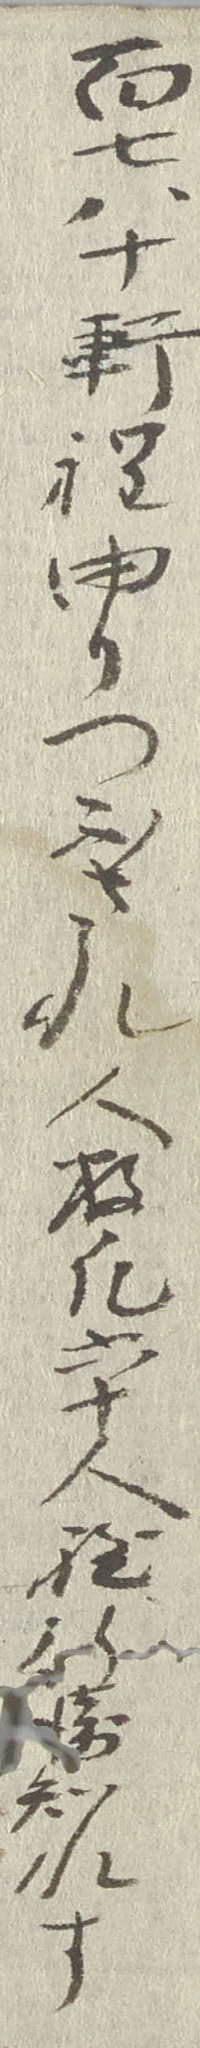百七八十軒程ゆりつぶされ人数凡六十人程行衛知れす
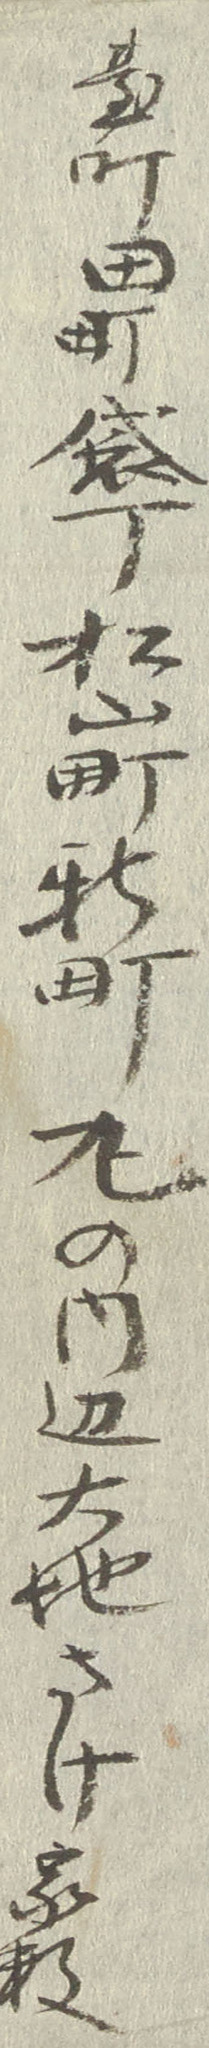臺町田町袋丁松山町新町丸の内辺大地さけ家数
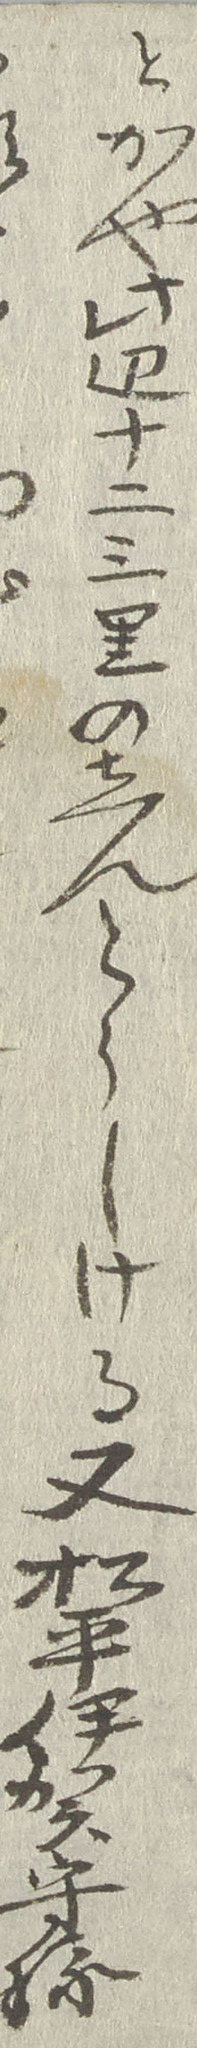とかや此辺十二三里のしんとうしける又松平伊賀守様
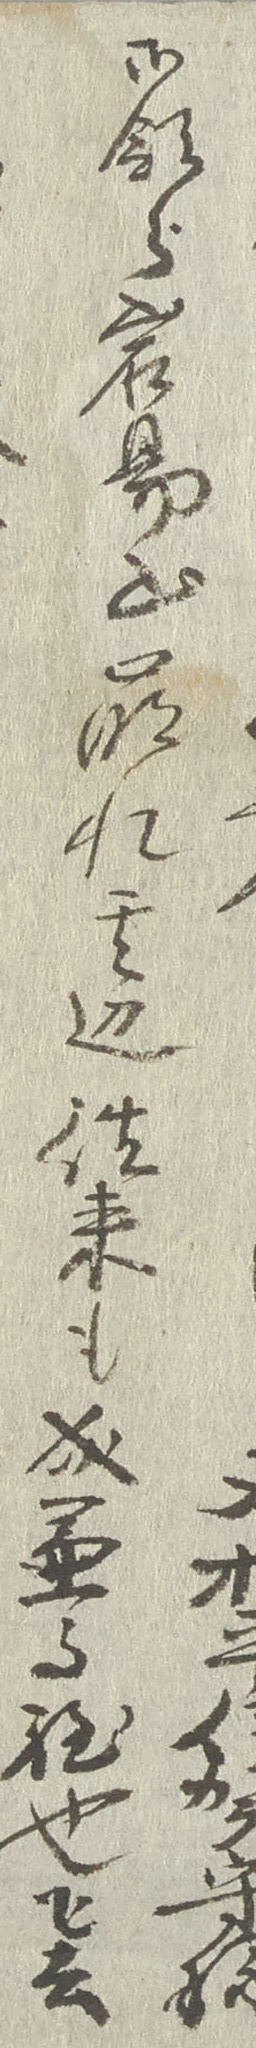御領分岩易山崩れ其辺往来も成兼る程也乍去
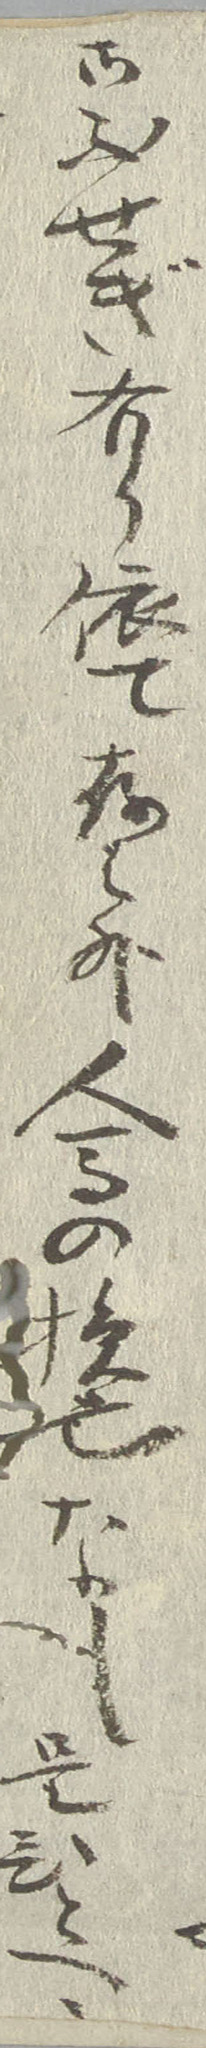御ふせぎ有り依て存の外人馬の損亡なし是ひとへニ
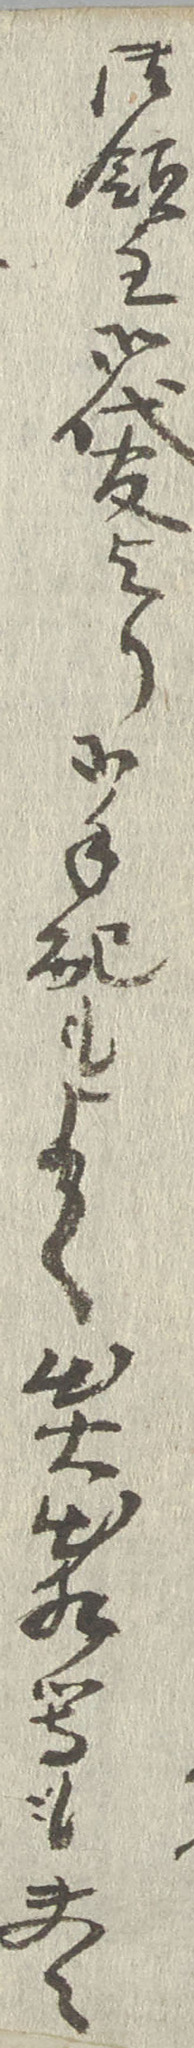御領主御代官より御手配もよく出火出水等も夫々
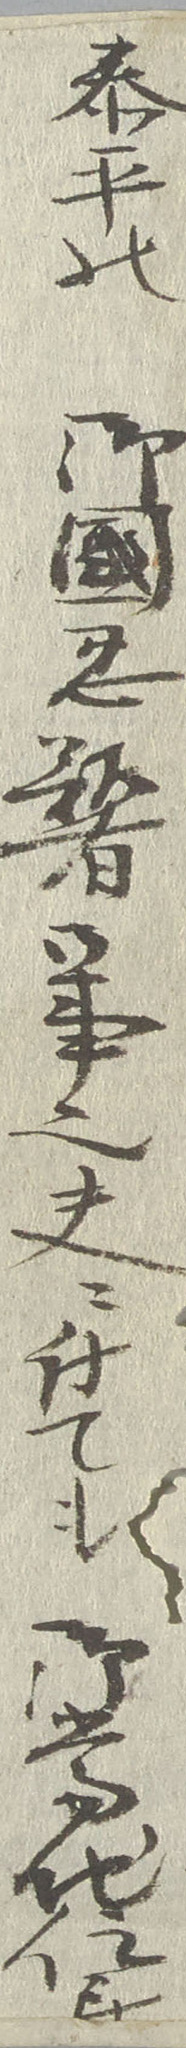泰平の御國恩難有御事也夫ニ付ても御當地住民
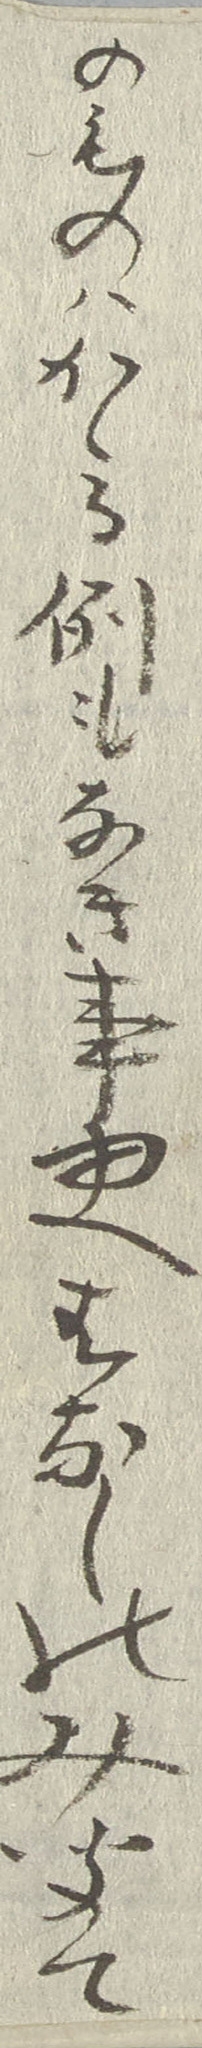のものハかゝる例もなき事ゆへはなしのみ聞て
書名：[善光寺地震摺物写]
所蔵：東京大学総合図書館 General Library in the University of Tokyo, JAPAN
